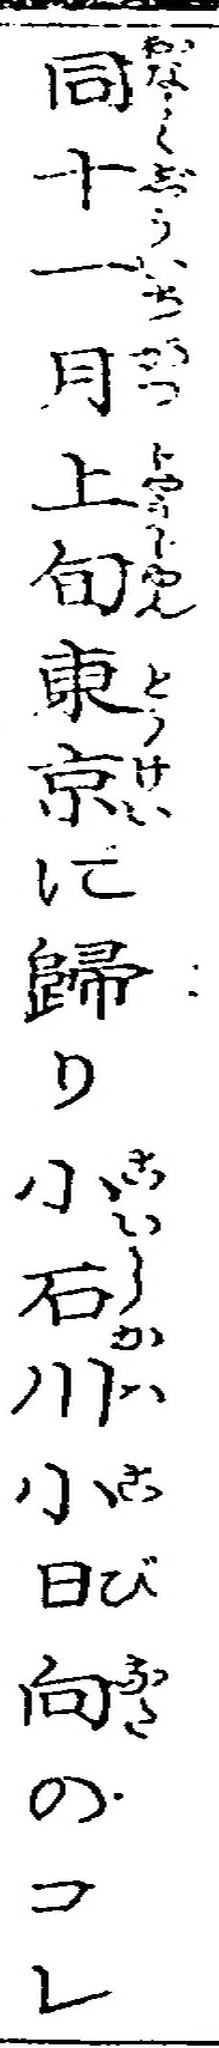同十一月上旬東京に帰り小石川小日向のコレ
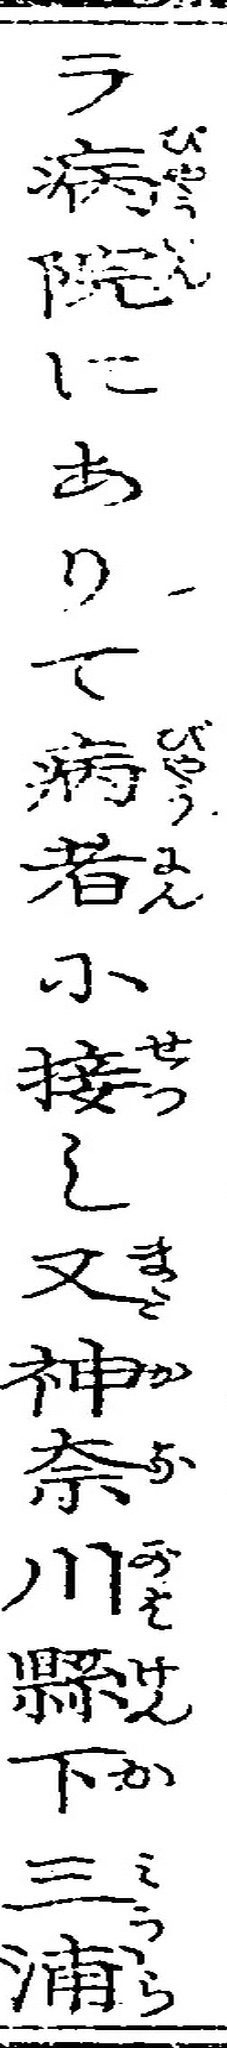ラ病院にありて病者に接し又神奈川縣下三浦
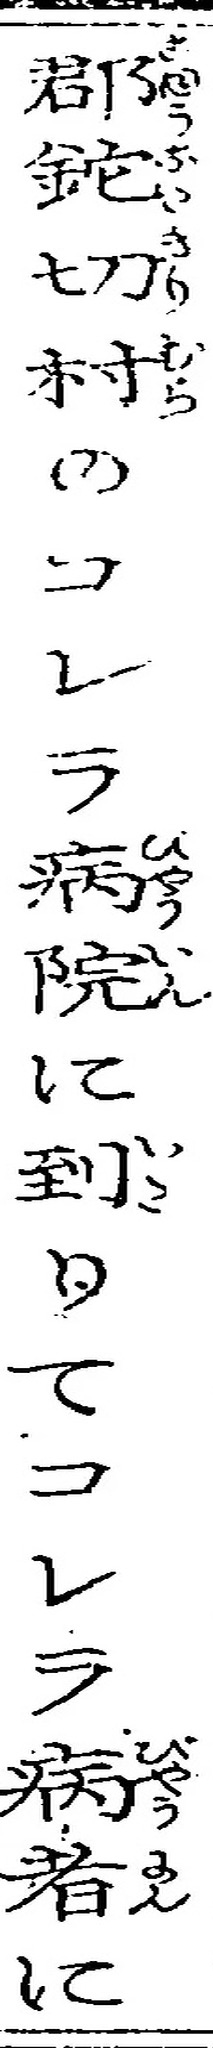郡鉈切村のコレラ病院に到りてコレラ病者に
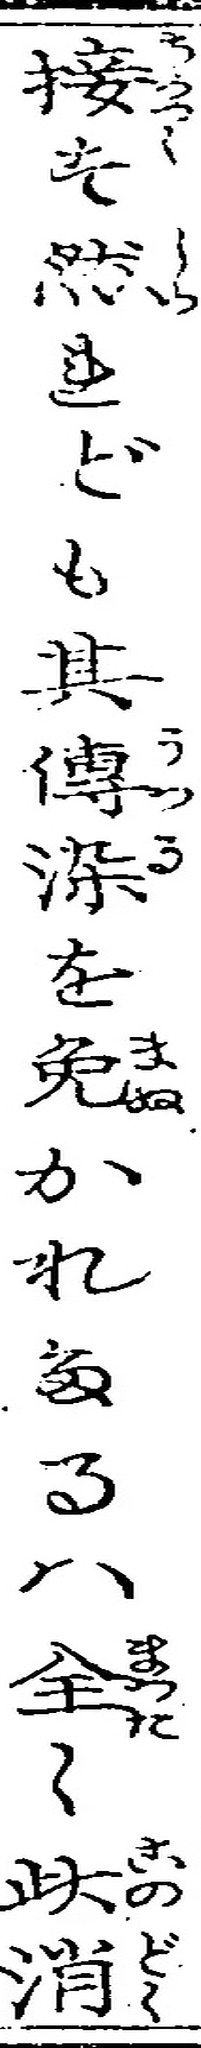接す然れども其傳染を免かれたるは全く此消
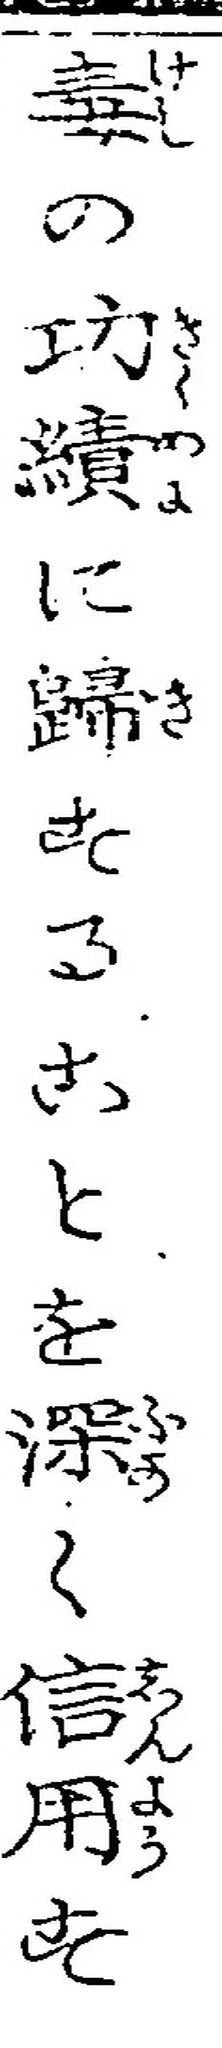毒の功績に帰することを深く信用す
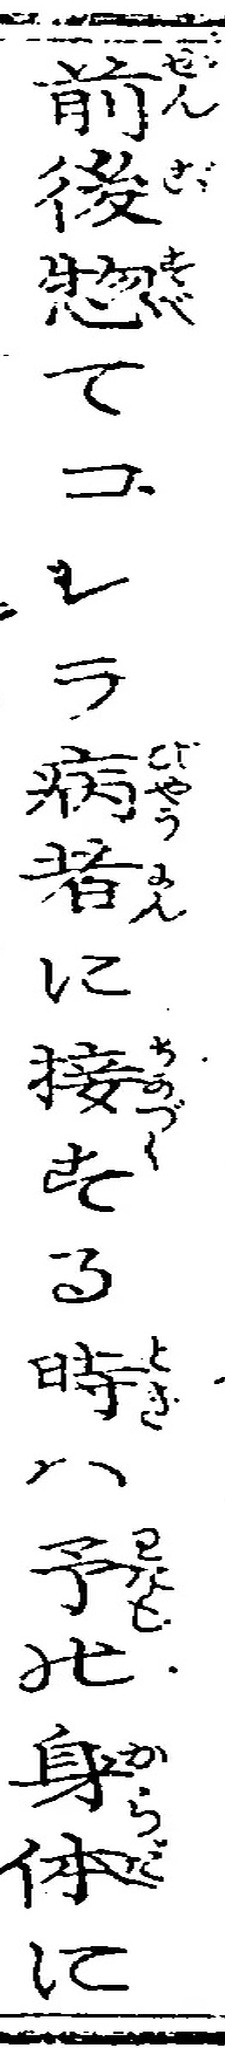前後惣てコレラ病者に接する時は予の身体に
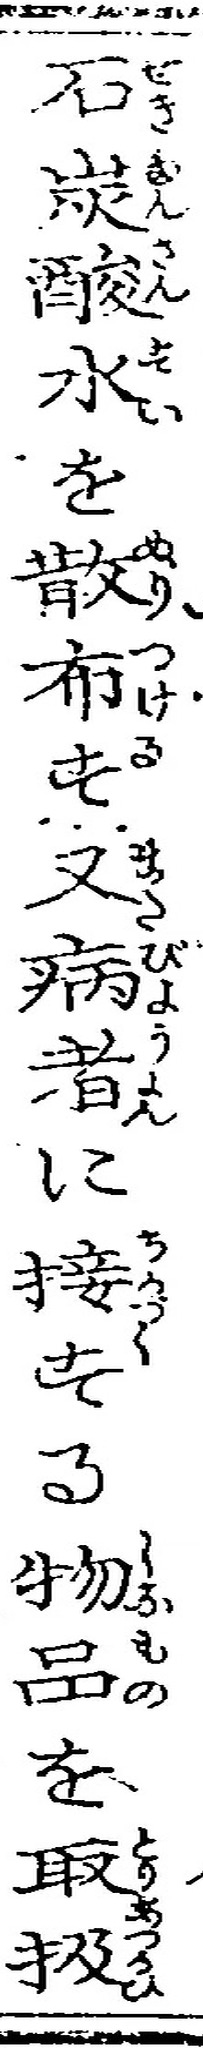石炭酸水を散布す又病者に接する物品を取扱
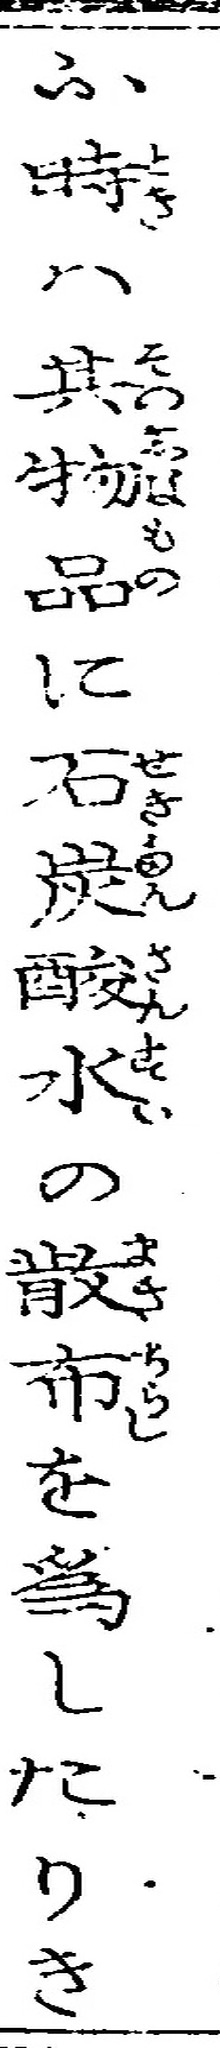ふ時は其物品に石炭酸水の散布を為したりき
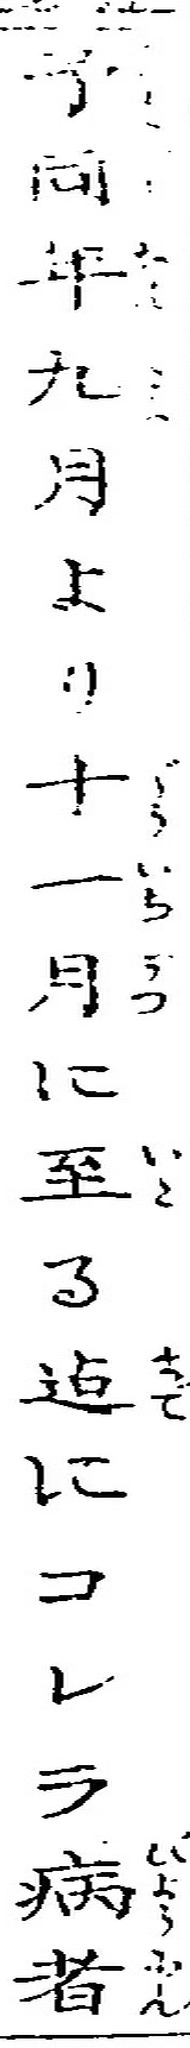予同年九月より十一月に至る迄にコレラ病者
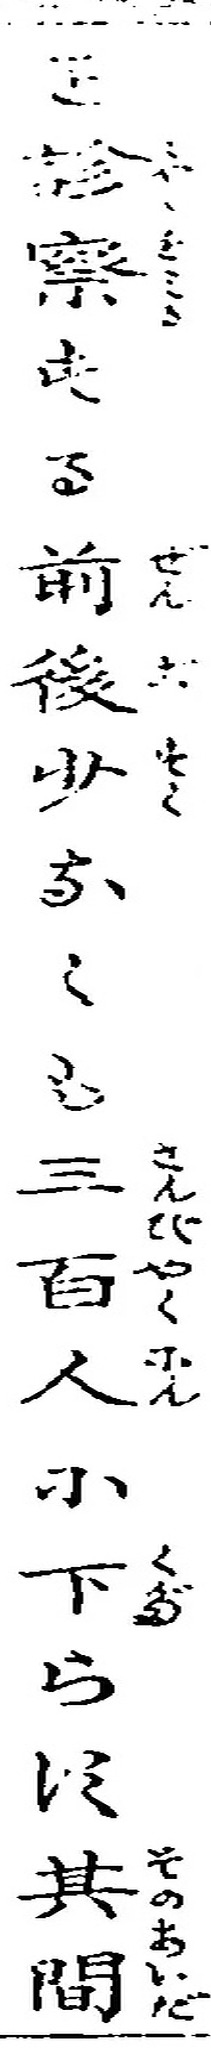を診察する前後少なくも三百人に下らす其間
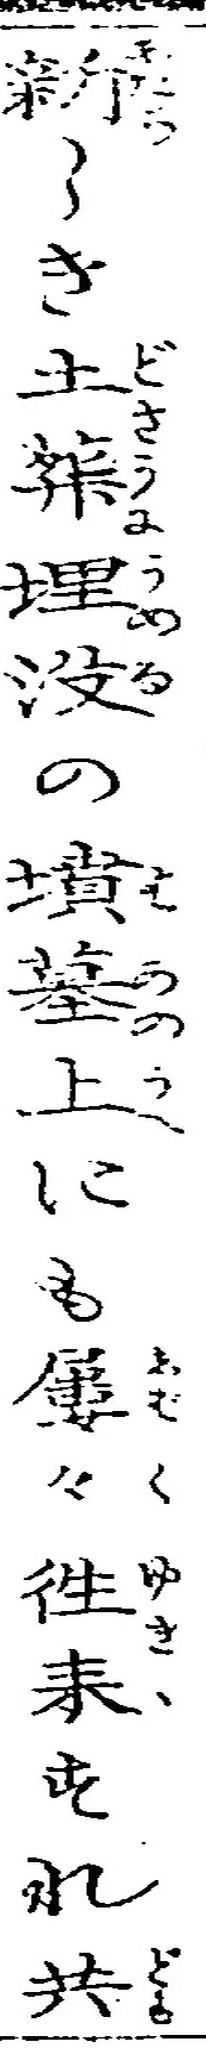新しき土葬埋没の墳墓上にも屡々往来すれ共
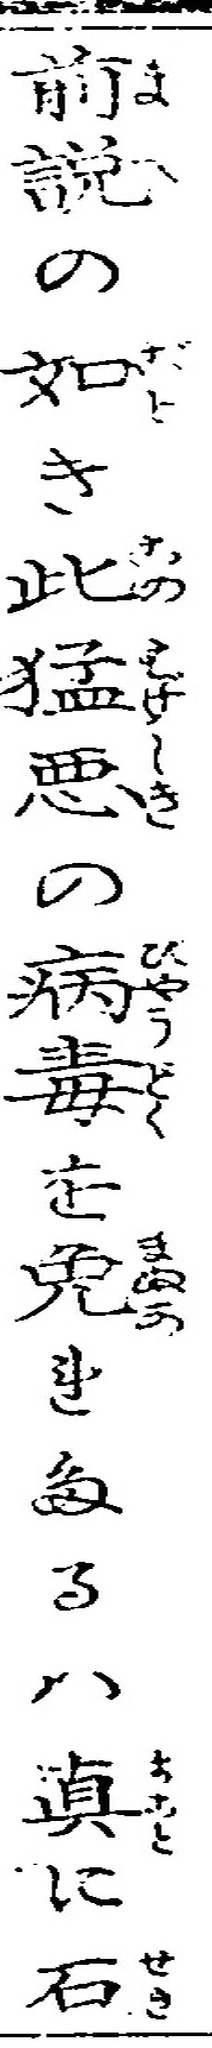前説の如き此猛悪の病毒を免れたるは真んい石
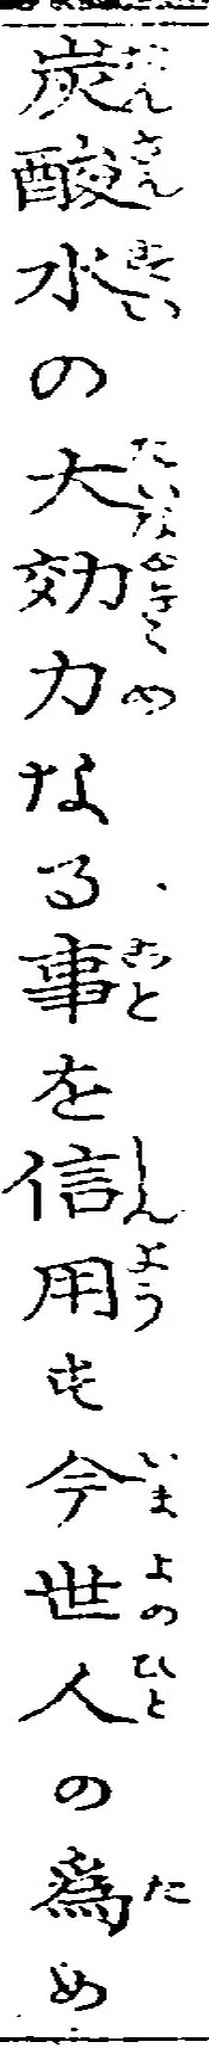炭酸水の大効力なる事を信用す今世人の為め
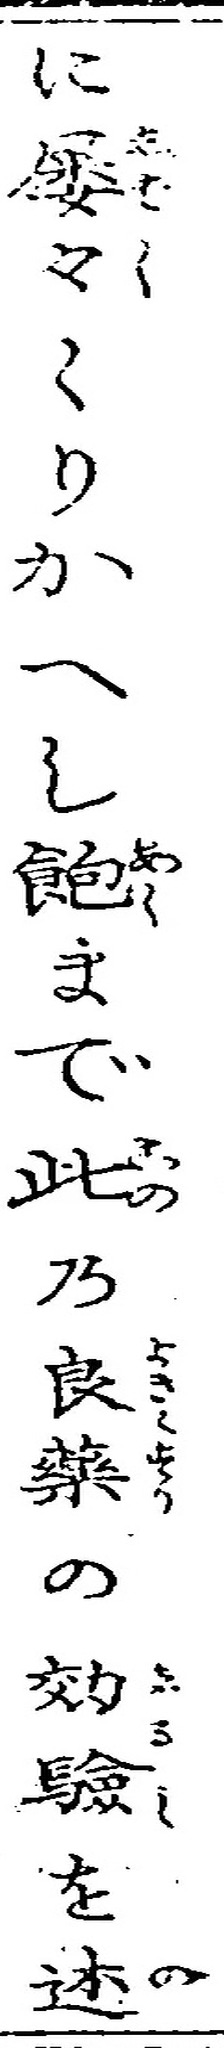に屡々くりかへし飽まで此乃良薬の効験を述
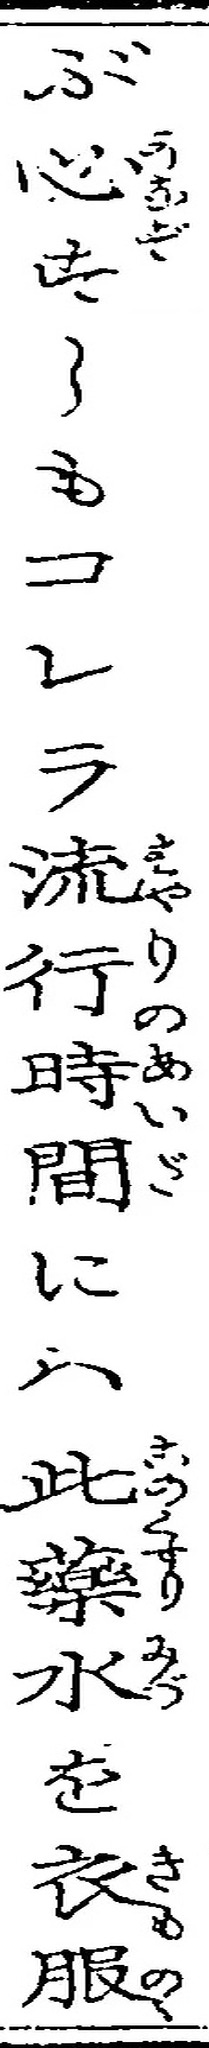ぶ必すしもコレラ流行時間には此藥水を衣服
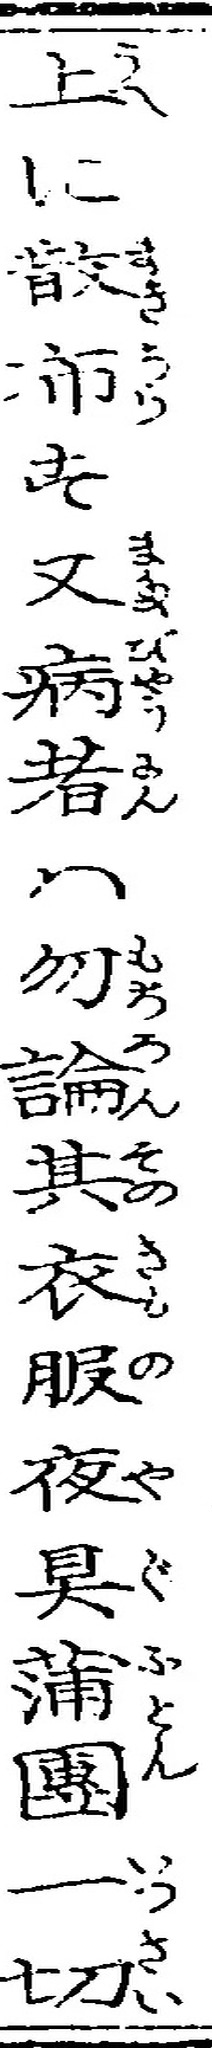上に散布す又病者は勿論其衣服夜具蒲団一切
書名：虎列剌予防民間の心得
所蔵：国立国会図書館 National Diet Library, JAPAN
